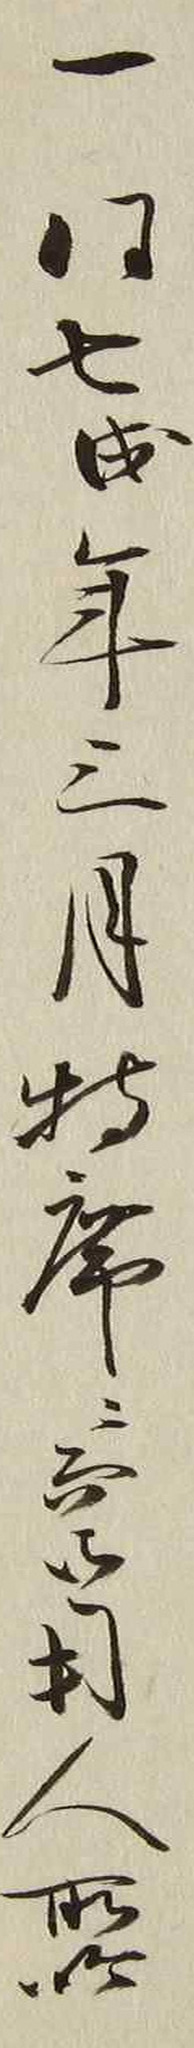一同七戌年三月持席ニ而御用人所吟
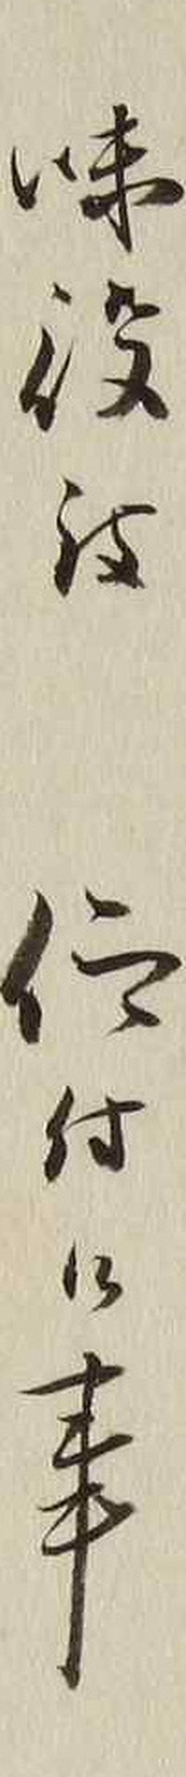味役被仰付候事
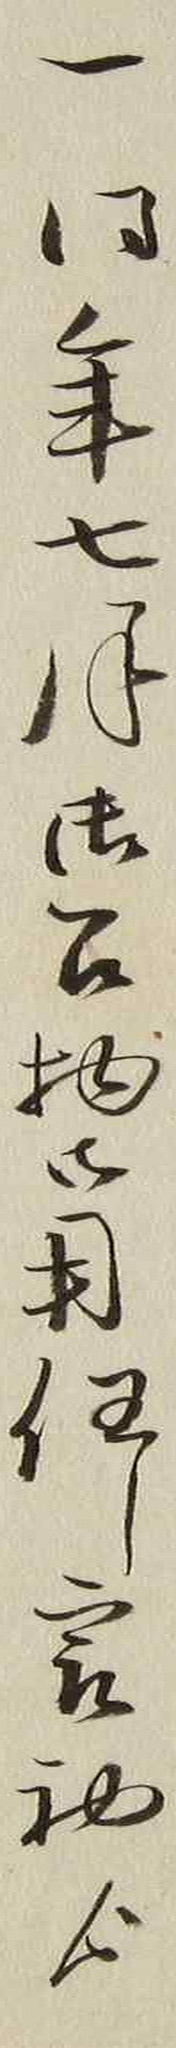一同年七月御召物御用任し最初ゟ
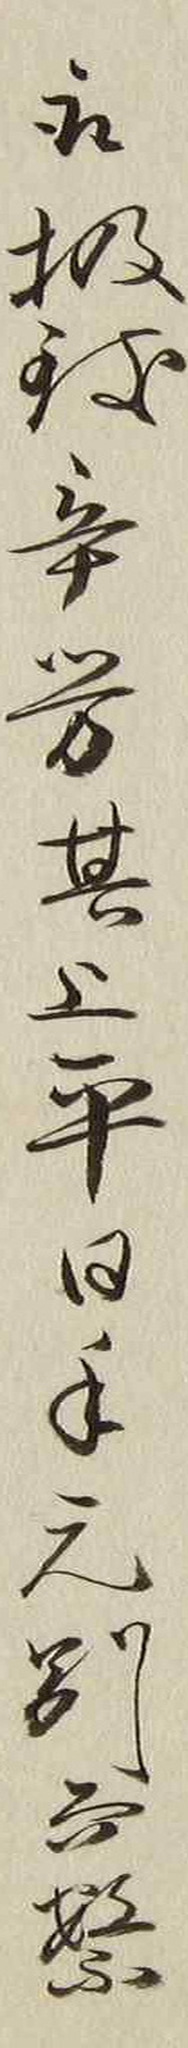取扱致辛労其上平日手元別而繫
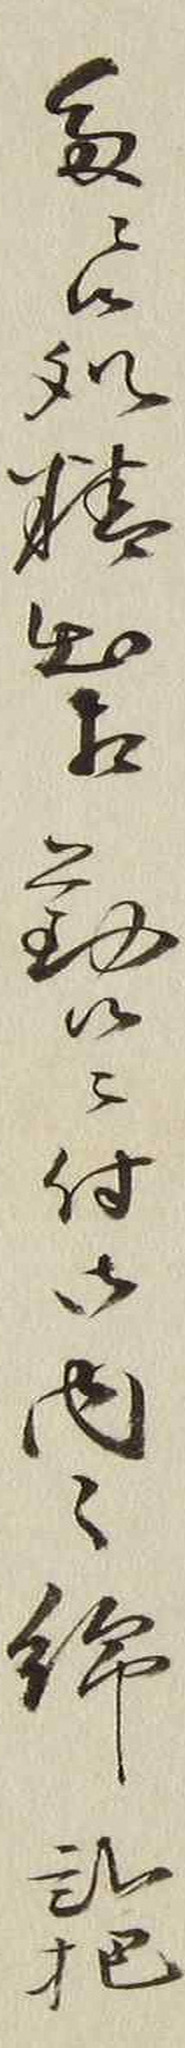多ニ候処精出相勤候ニ付御内々綿弐把
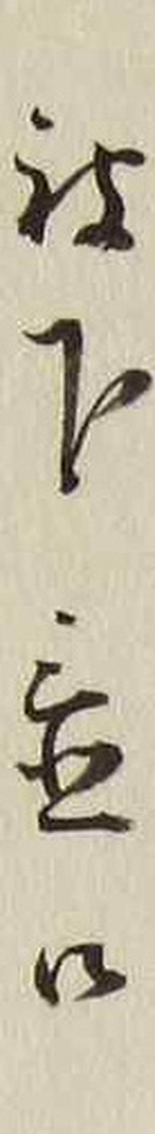被下置候
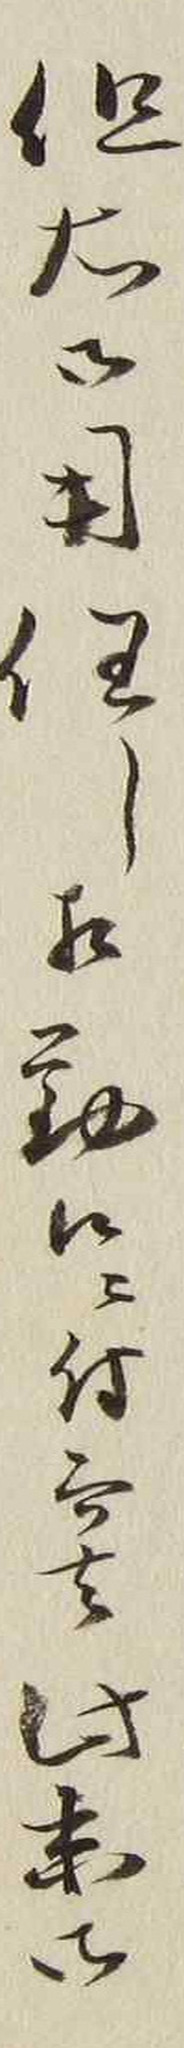但右御用任し相勤候ニ付而は此末御
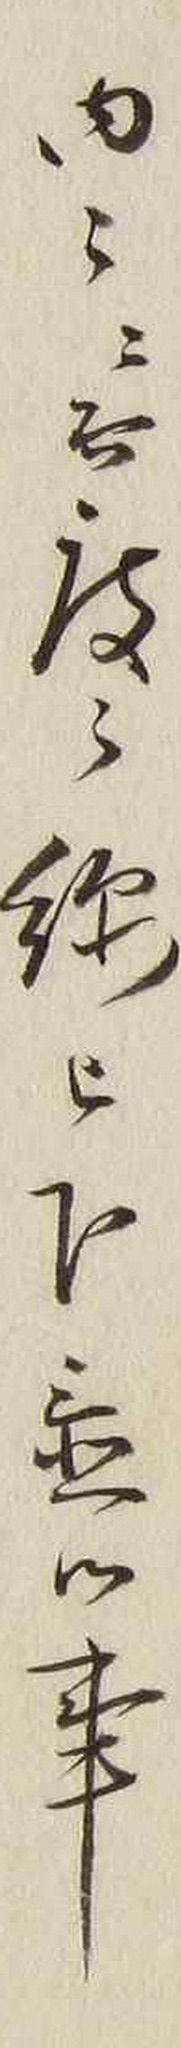内々ニ而度々綿被下置候事
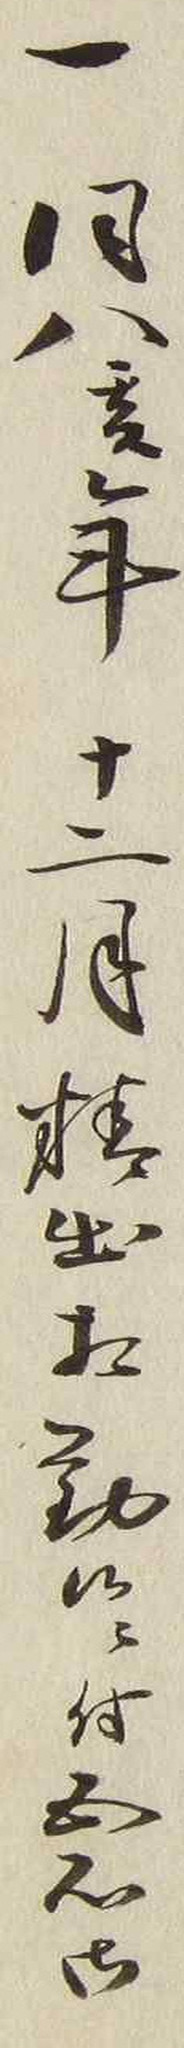一同八亥年十二月精出相勤候ニ付五石御

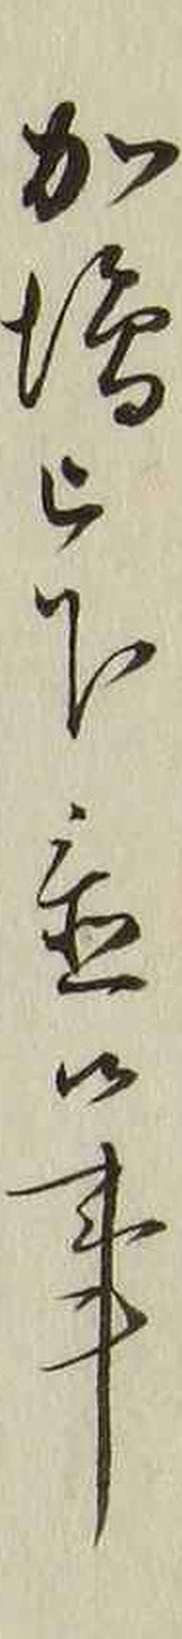加増被下置候事
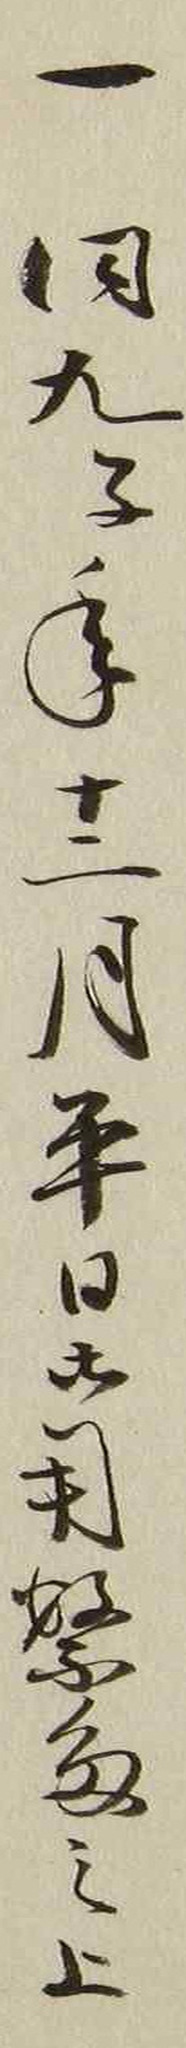一同九子年十二月平日御用繫多之上
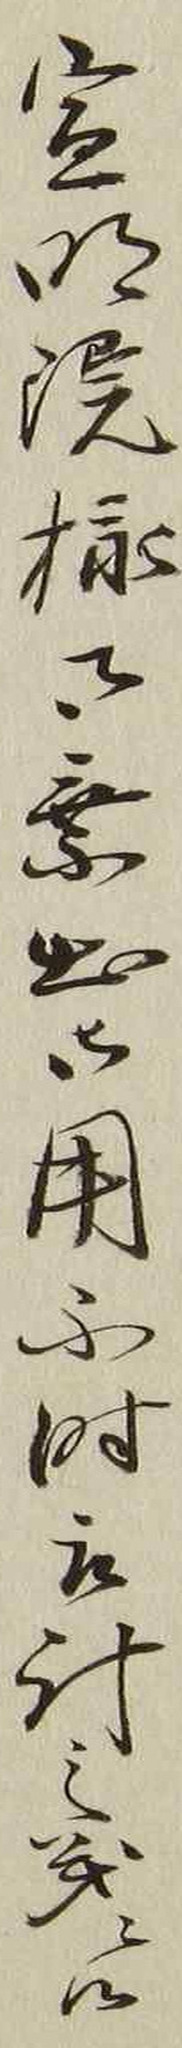宣明院様御乗出御用不時取計之義ニ候
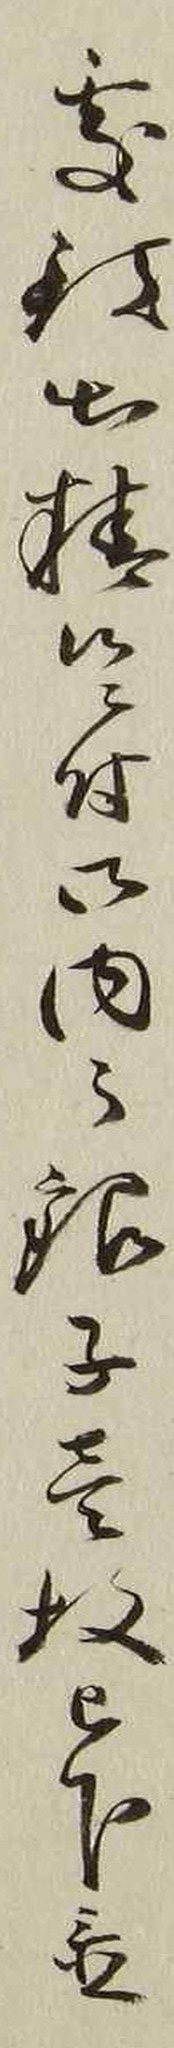処致出精候ニ付御内々銀子壱枚被下置
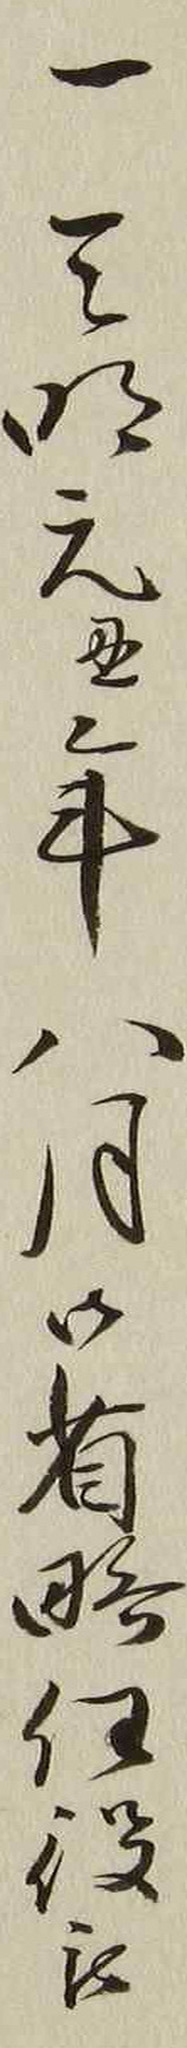一天明元丑年八月御省略任役被
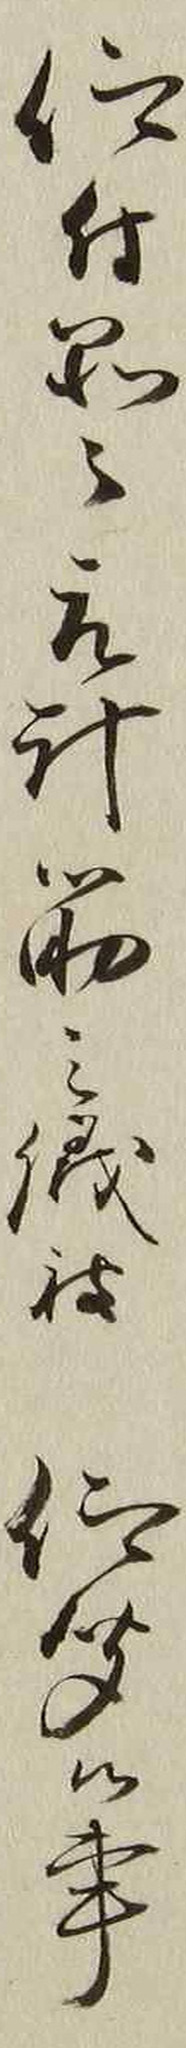仰付品々取計筋之儀被仰聞候事
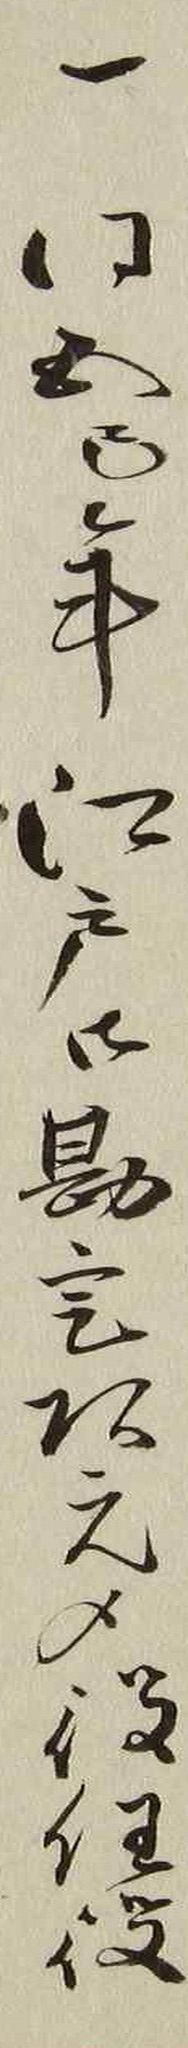一同五巳年江戸御勘定頭元〆役任役
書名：諸士系譜　巻之163　な之部5
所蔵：会津若松市立会津図書館
